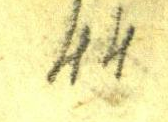44
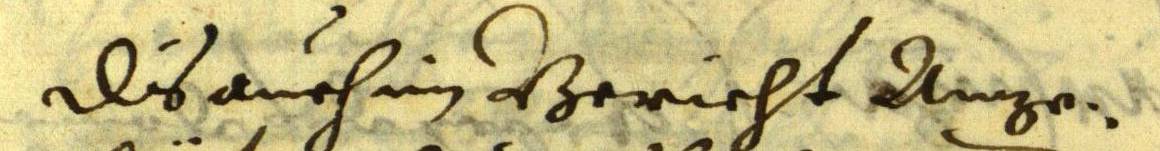dis aūch im Bericht Anze¬
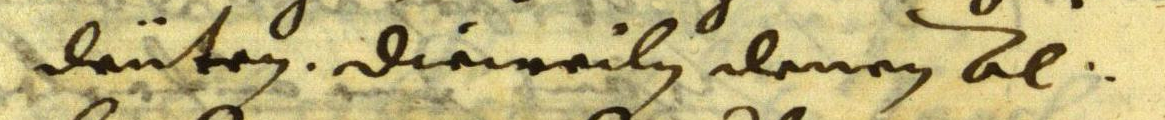deüten. dieweiln denen Al¬
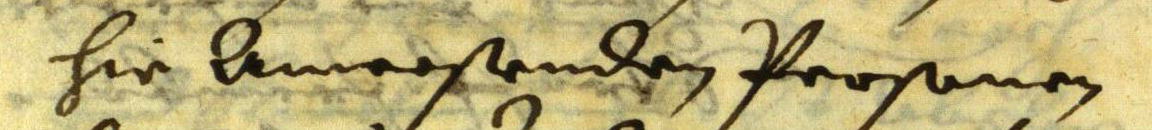hir Anwesenden Personen
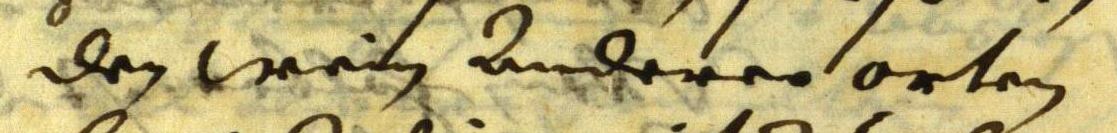den Wein Anderer orten
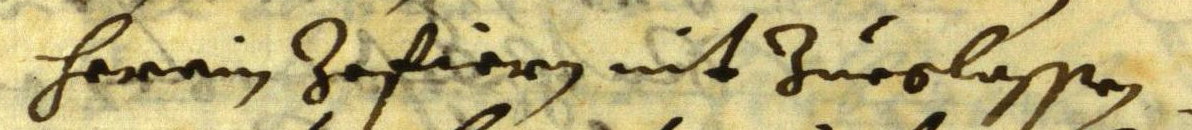herein Zefiern nit Zūeglassen.
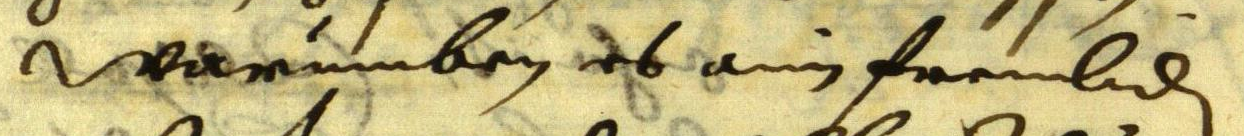Warūmben es ain frembd
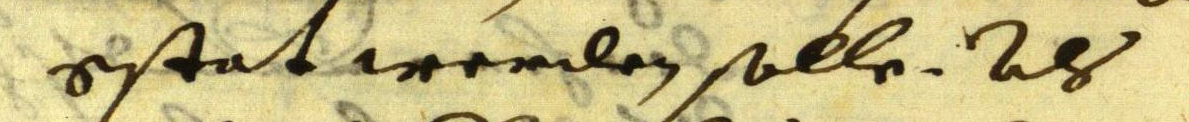gstat werden solle. Als
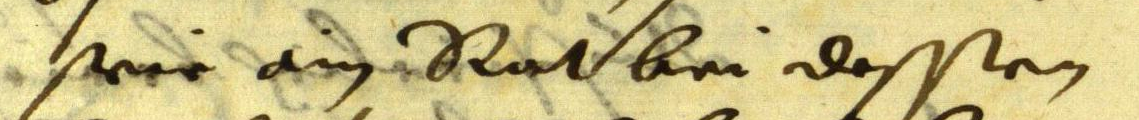seie ain Rat bei dessen
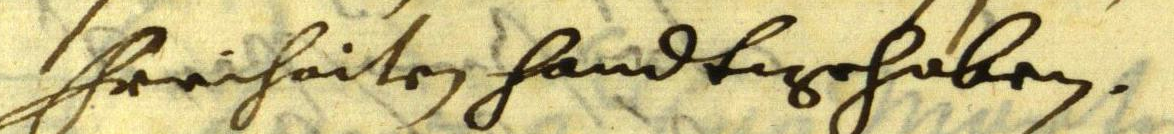Freihaiten handzehaben.
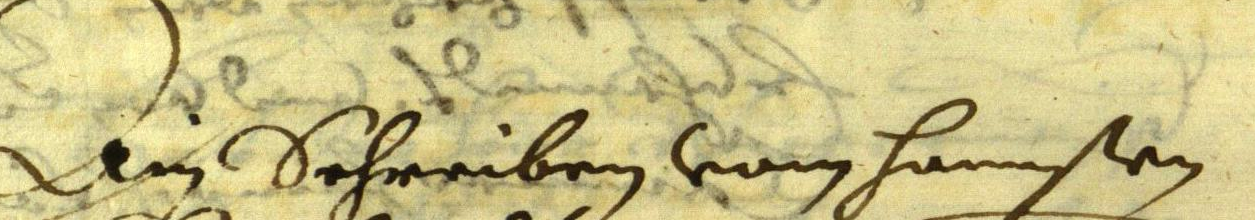Ain Schreiben vom Hannsen
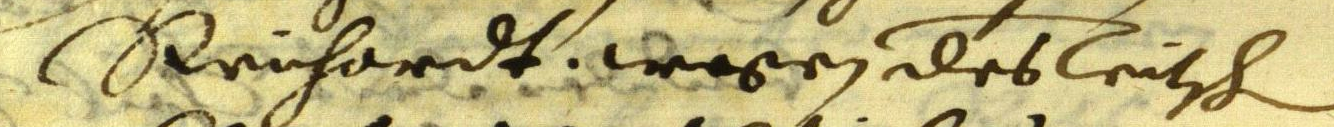Reichardt. wegen des Teitsch
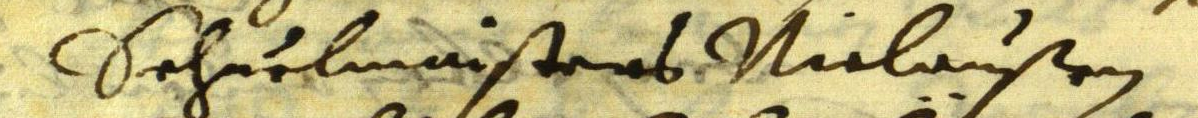Schūelmaisters Niclaūsen
